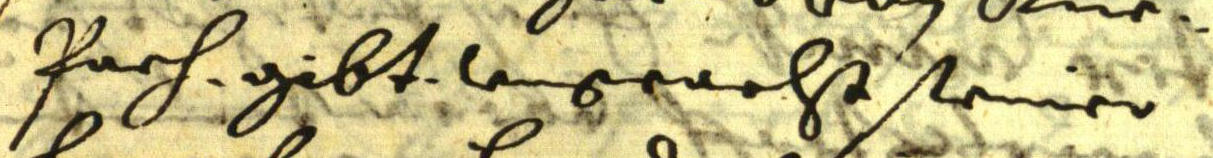Pach. gibt. vngeacht seiner
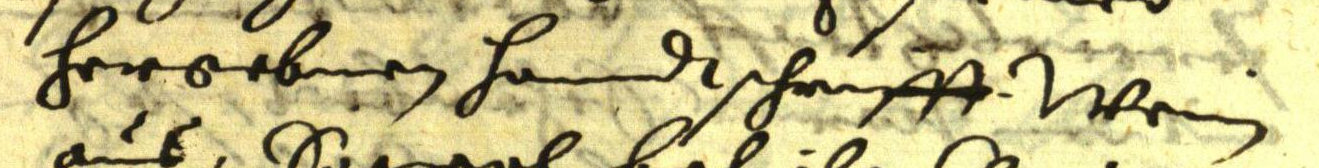hergebnen hanndtschrifft. Wein
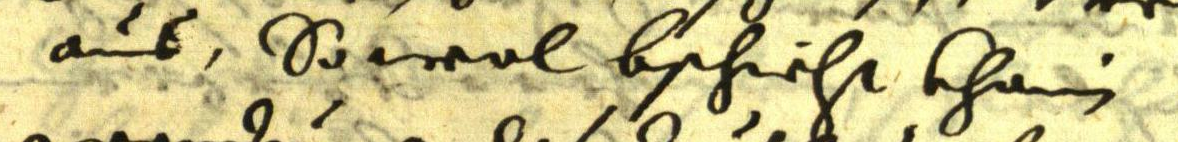aūs, So wol bschicht khain
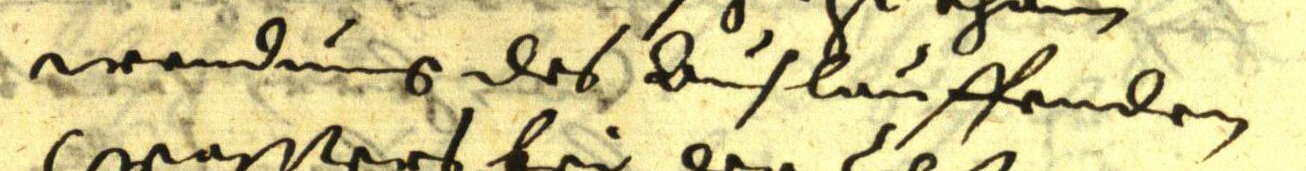wendūng des Aūslaūffenden
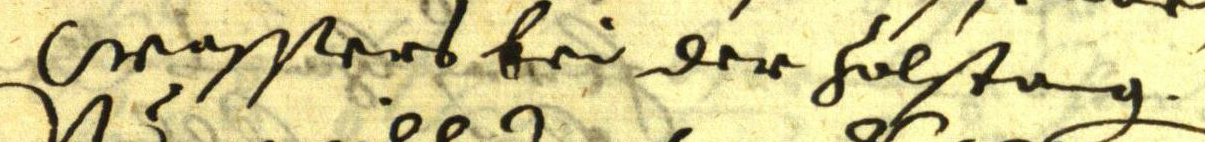Wassers bei der Zolstang.
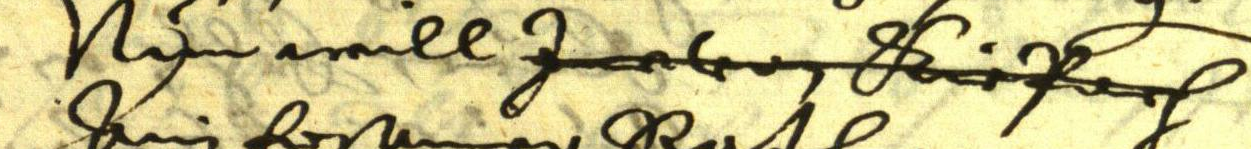Nūn will Ime von KiePach
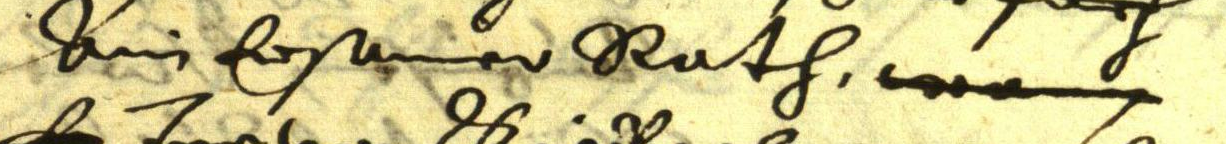Ain Ersamer Rath. wann
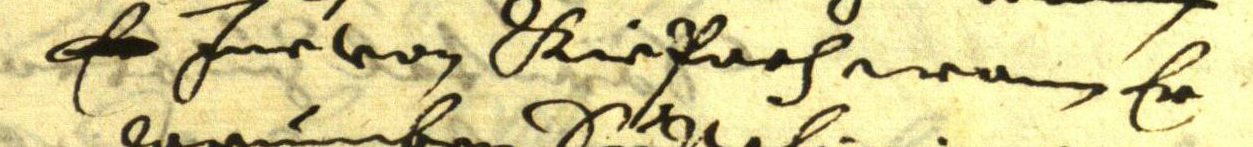Er Ime von KiePach wann Er
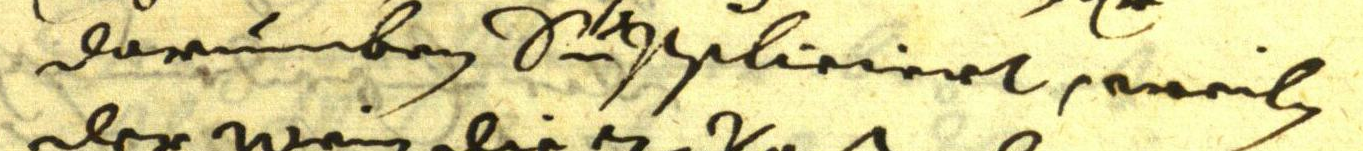darūmben SūPpliciert, weiln
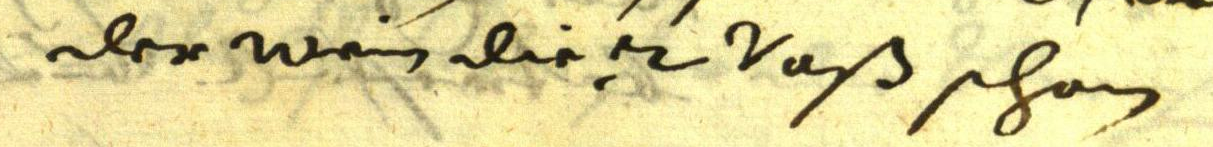der wein die .2 Vaß schon
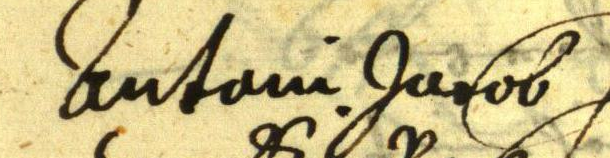Antoni Jacob
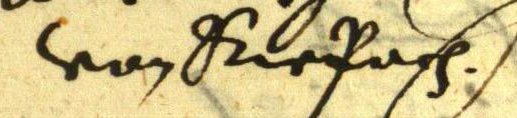von KiePach.
